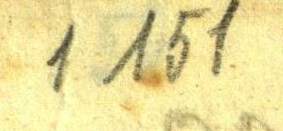1 151
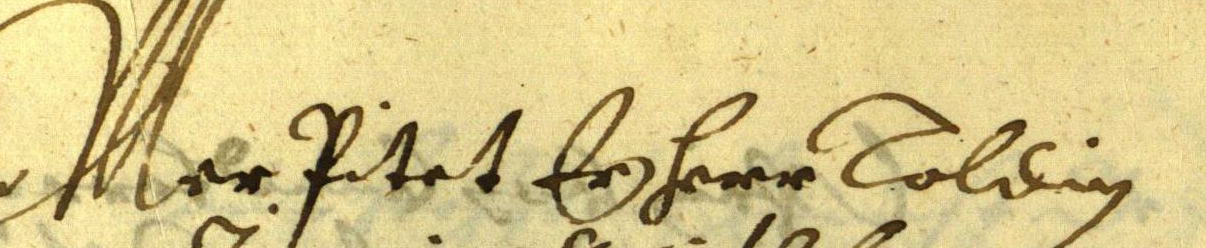Mer Pitet Er herr Toldin
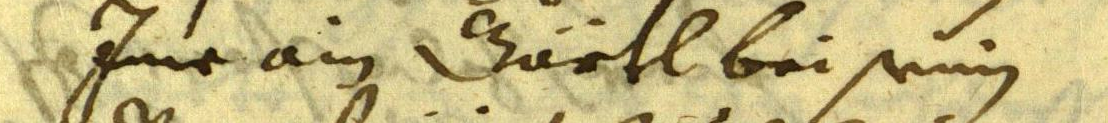Ime ain Gärtl bei seim
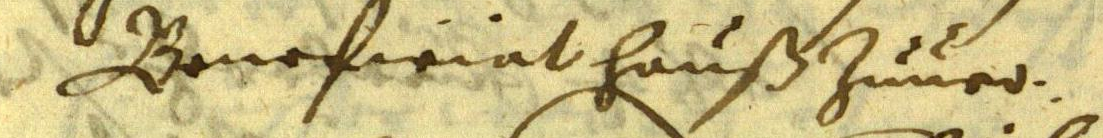Beneficiat haūß Zūūer¬
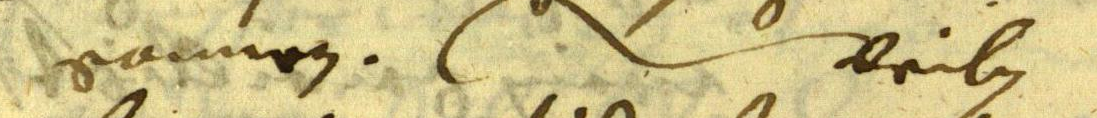gonnen. Weiln
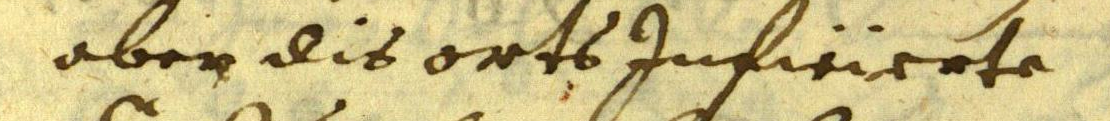aber dis orts Inficierte
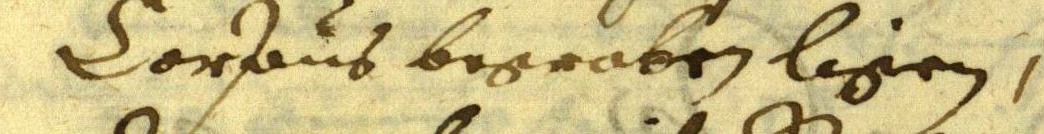CorPūs begraben ligen,
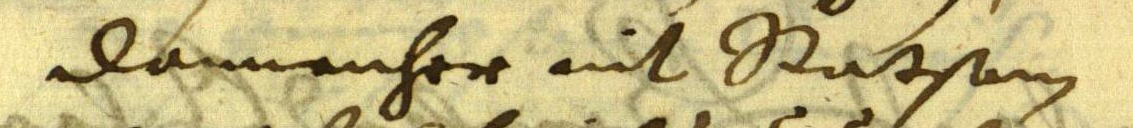dannenher nit Ratsam
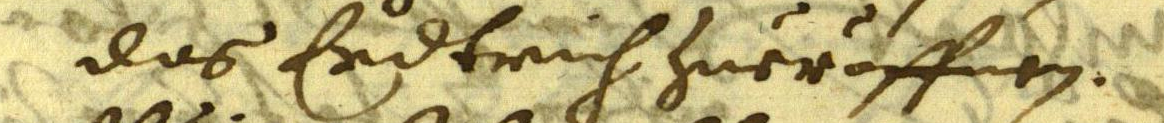das Erdtreich Zūerōffnen.
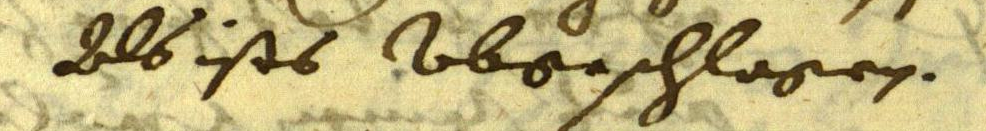Als ists Abgeschlagen.
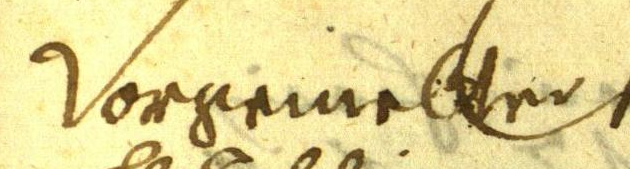Vorgemelter
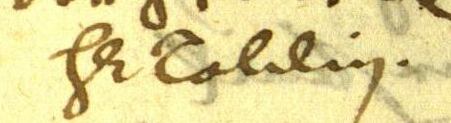h Toldin.
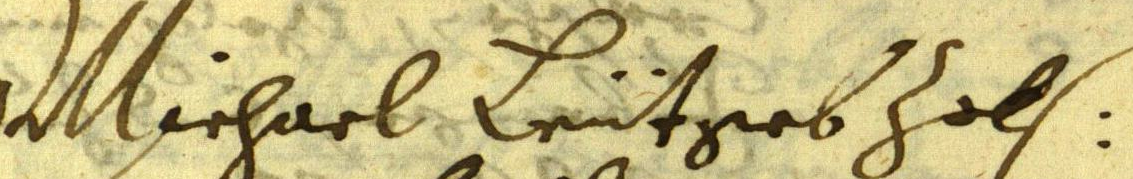Michael Leütgeb Zols¬
